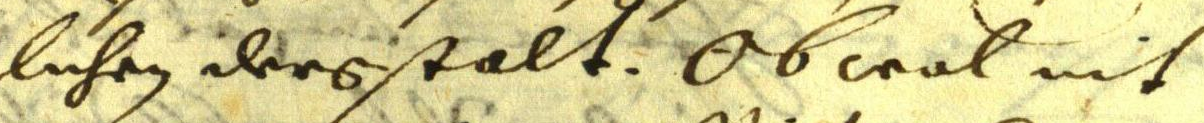lichen derstalt. Obwol nit
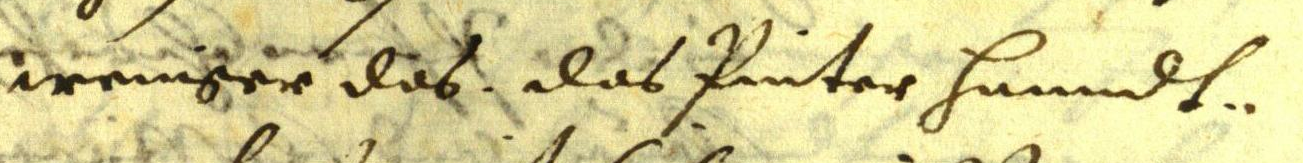weniger das das Pinter Hanndt¬
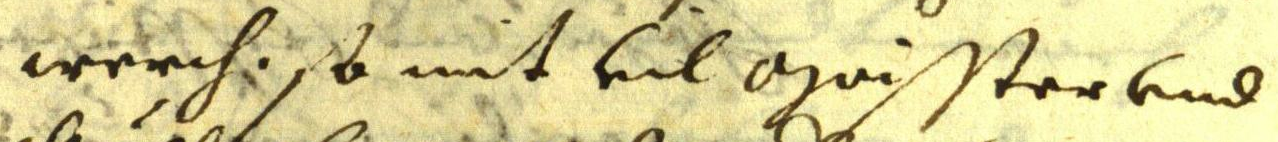werckh. so mit vil Maisster vnd
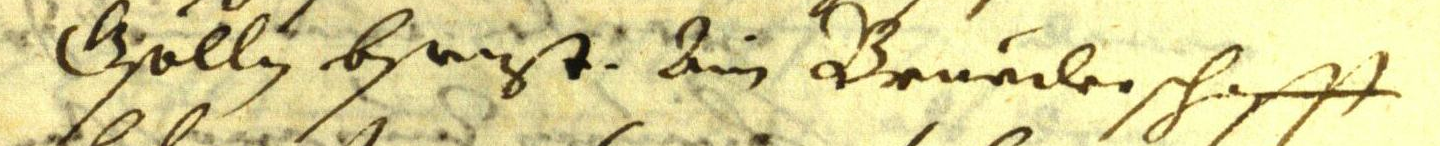Gsōlln bsitzt. Ain Brūederschafft
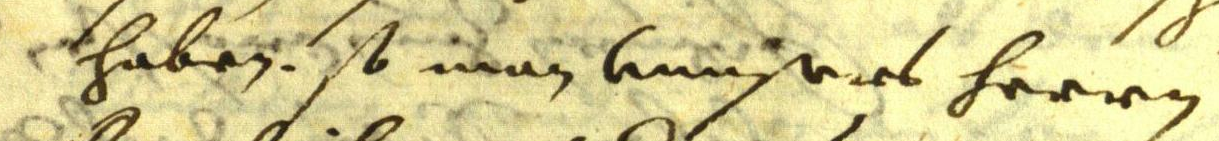haben. so man unnsers herrn
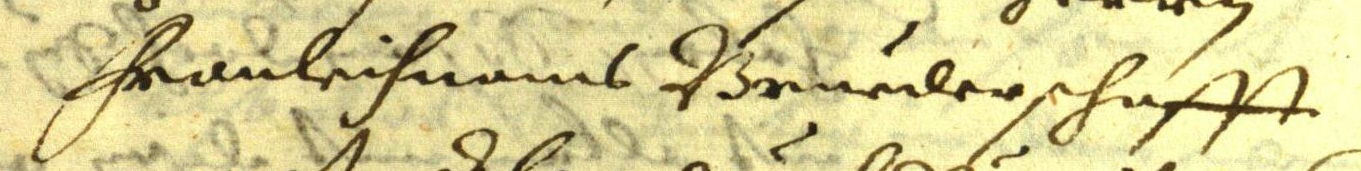Fronleichnams Brūederschafft
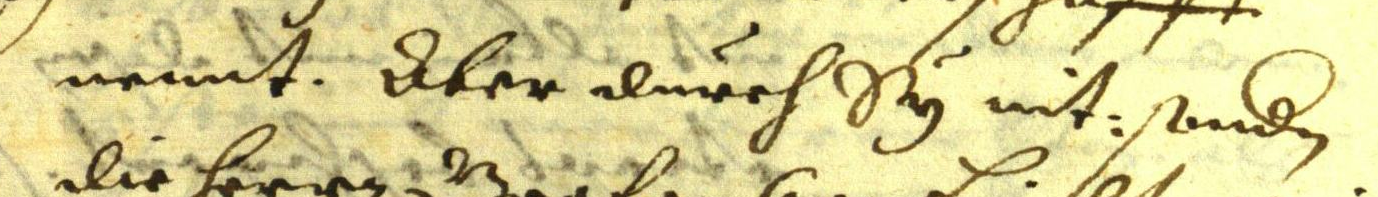nennt. Aber dūrch Sȳ nit: sondn
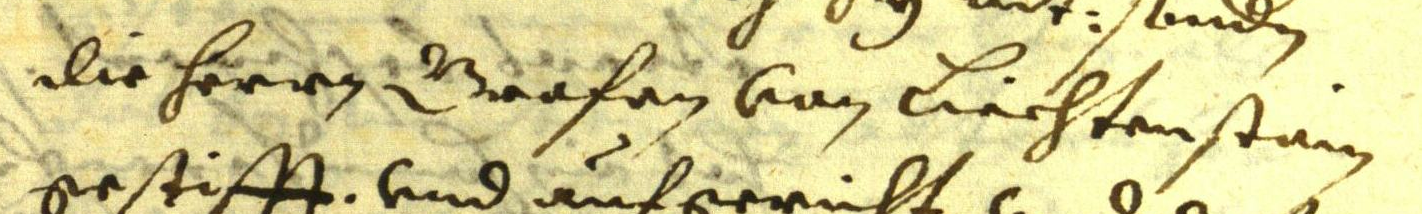die herrn Grafen von Liechtenstain
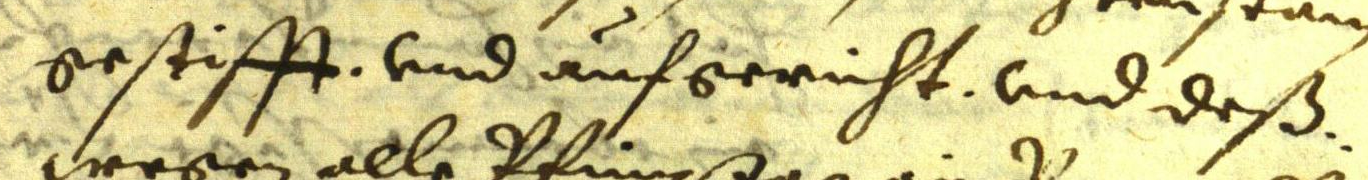gestifft. vnd aūfgericht. vnd dess¬
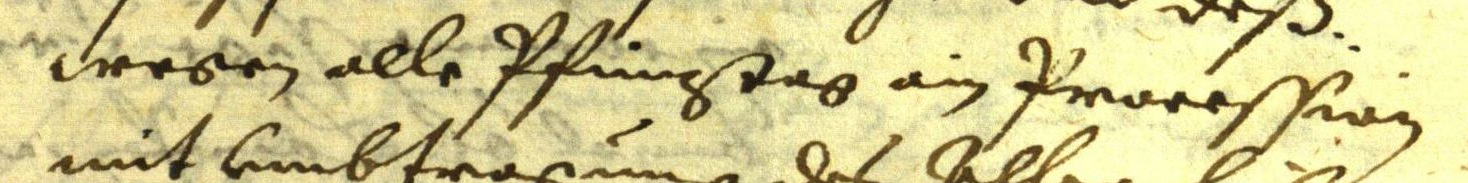wegen alle Pfinztag ain Procession
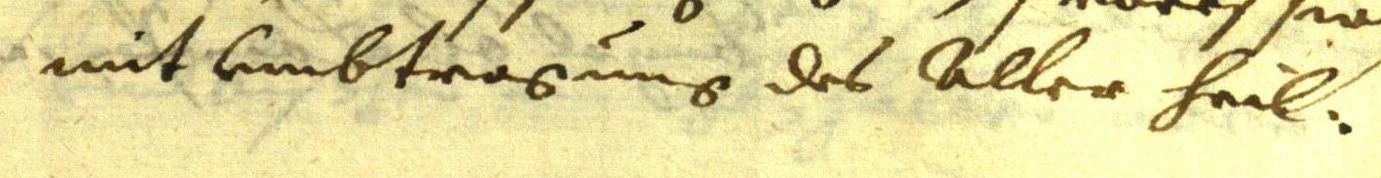mit vmbtragūng des Aller heil¬
